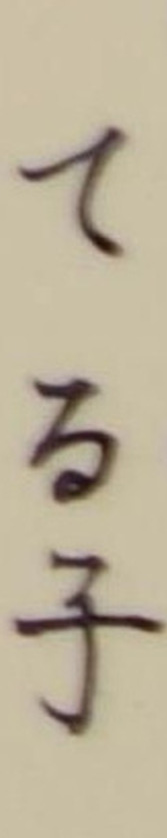てる子
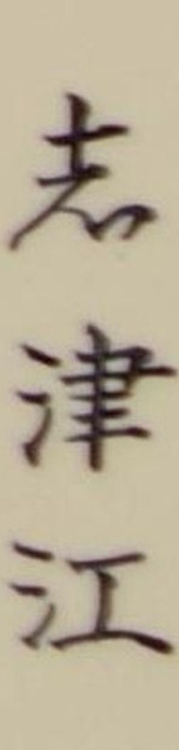志津江
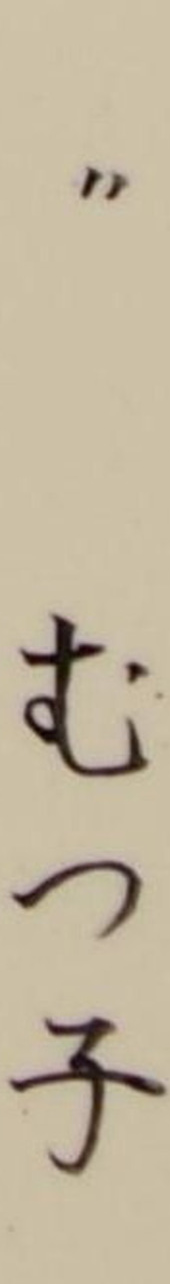むつ子
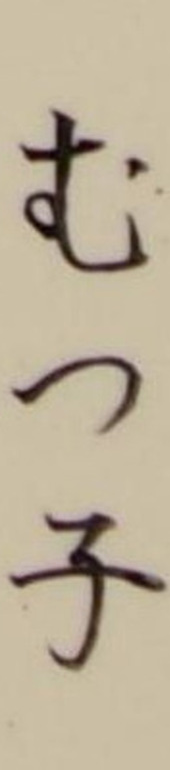むつ子
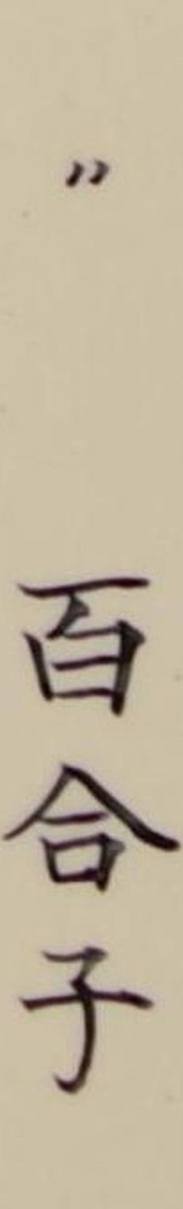百合子
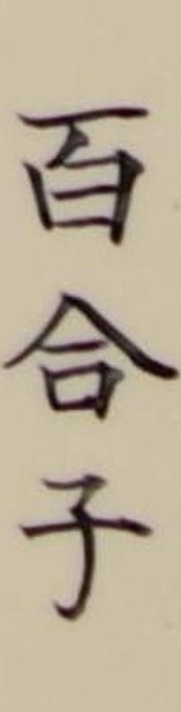百合子
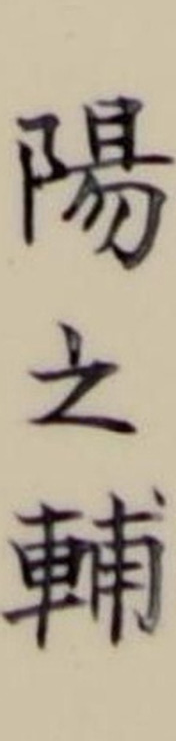陽之輔
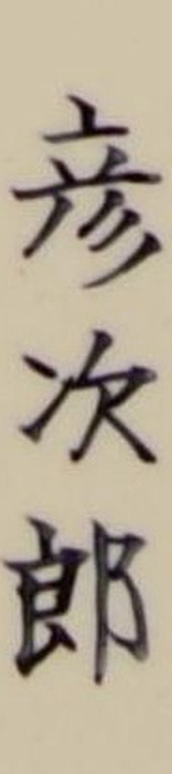彦次郎
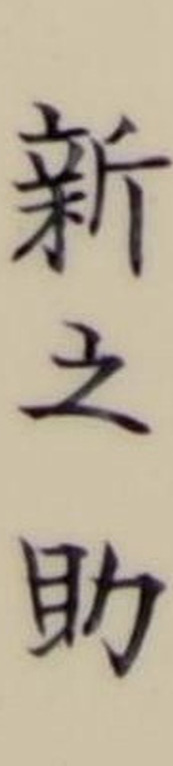新之助
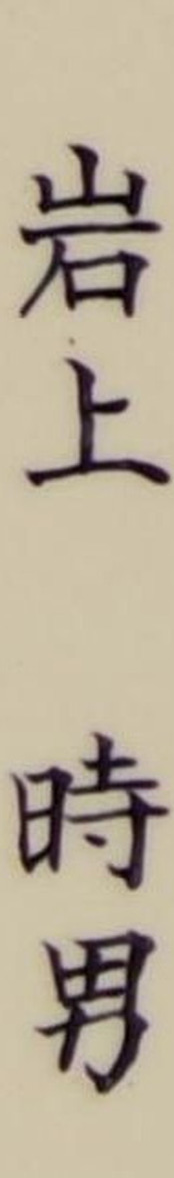岩上時男
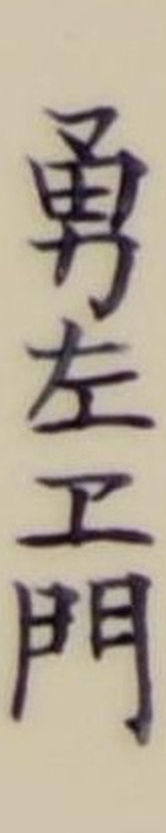勇左ヱ門
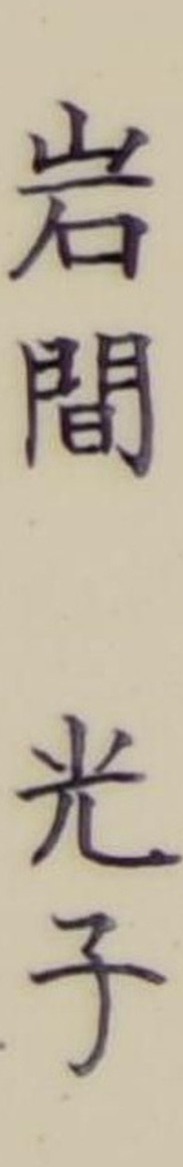岩間光子

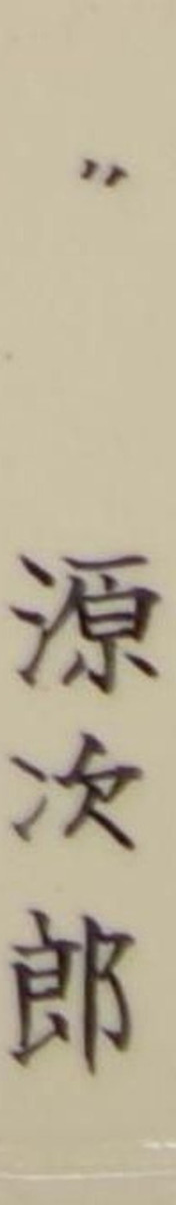源次郎
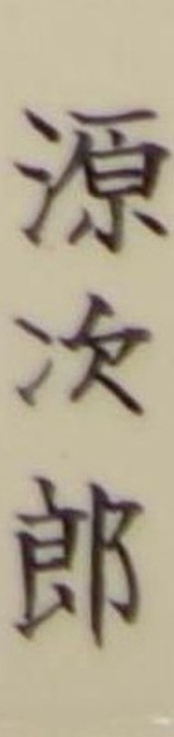源次郎
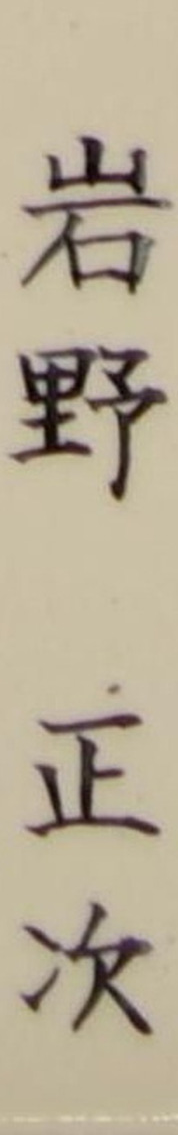岩野正次
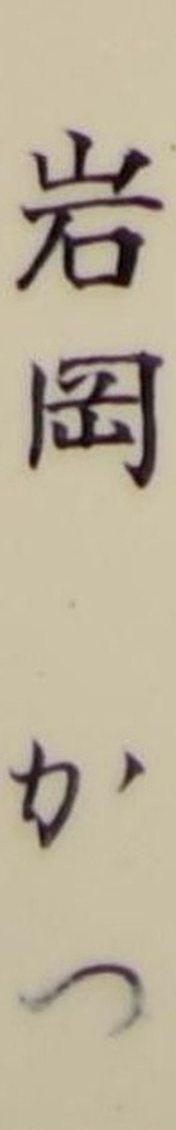岩岡かつ
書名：A~D
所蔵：koyasan kongobuji
